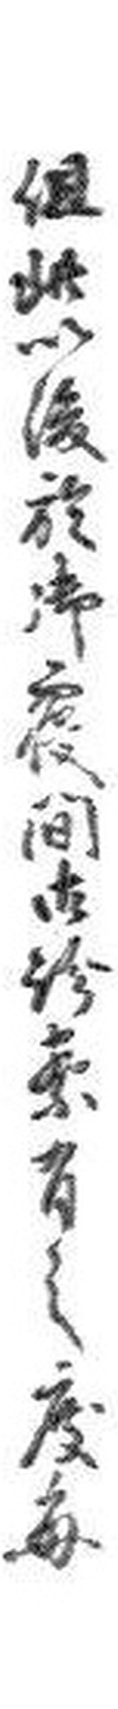但此以後御寝間御診察有之度毎
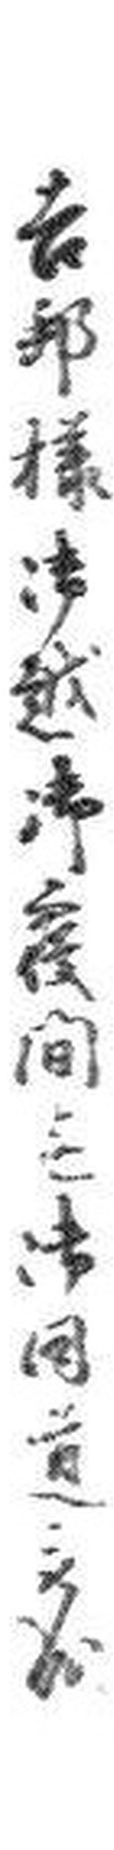吉邦様御越御寝間迄御同道被成
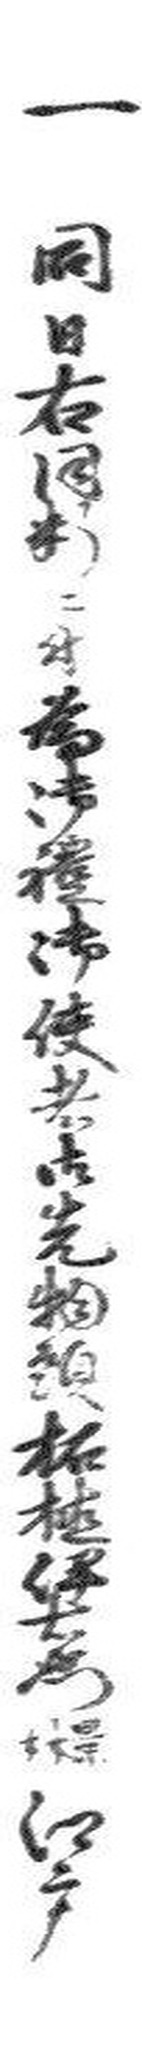一同日右同断ニ付為御礼御使者御先物頭柘植伊右衛門景林江戸
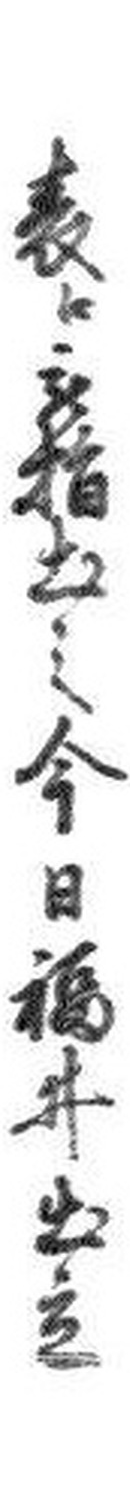表江被指出之今日福井出立
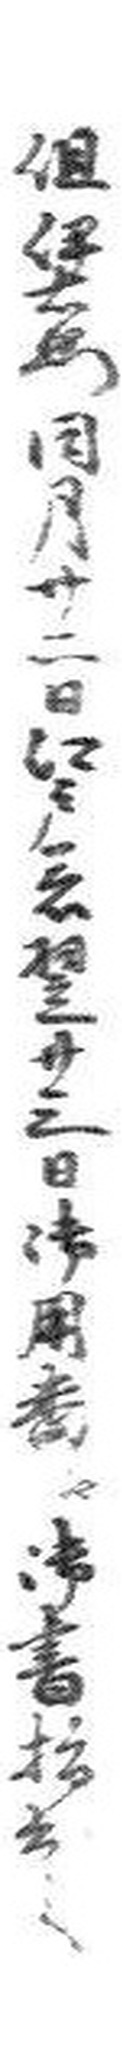但伊右衛門同月廿二日江戸着翌廿三日御用番江御書指出之
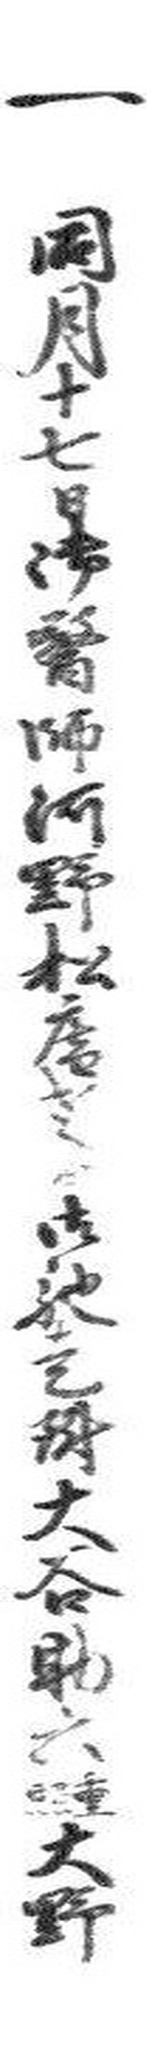一同月十七日御医師河野松庵老ゟ御馳走附大谷助六重照大野
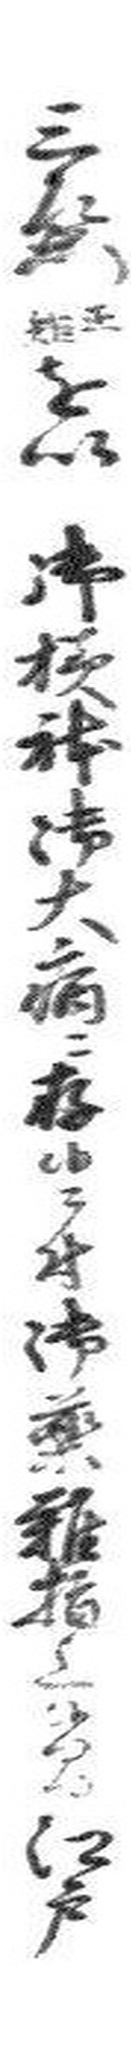三左衛門正矩を以御様体御大病ニ存候ニ付御薬難指上候間江戸
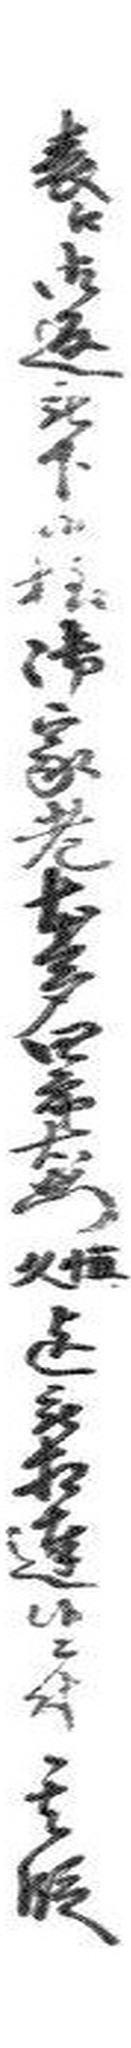表江御返被下候様御家老本多四郎右衛門恒久迄被相達候ニ付其段

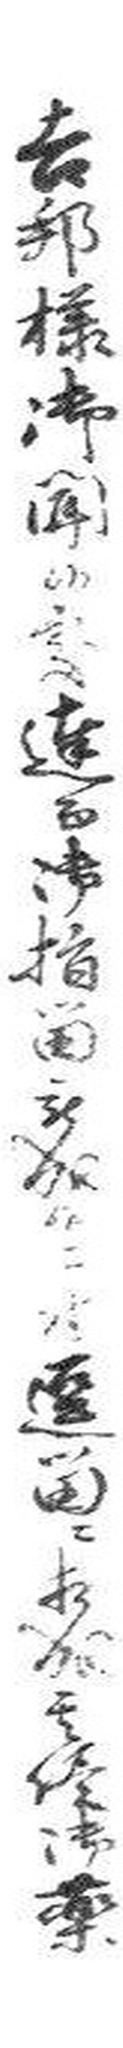吉邦様御聞候処達而御指留被成候ニ付逗留ニ相成其儘御薬
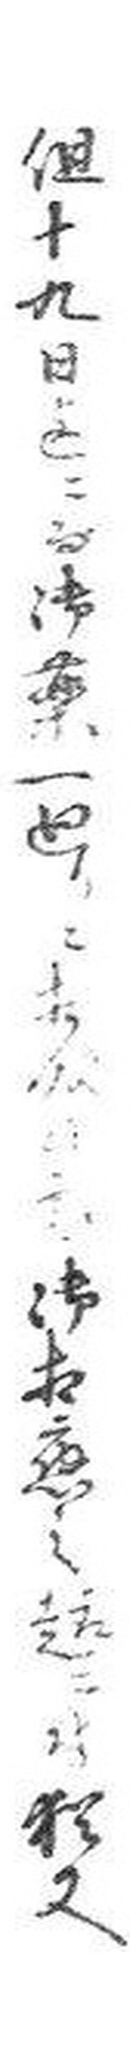但十九日迄ニ御薬一廻リニ相成候処御相応之趣ニ付猶又
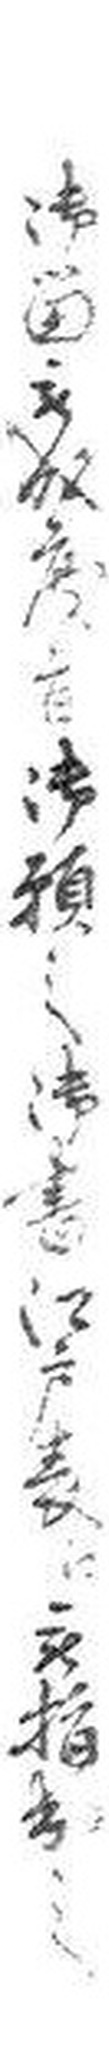御留被成度旨御願之御書江戸表江被指出之
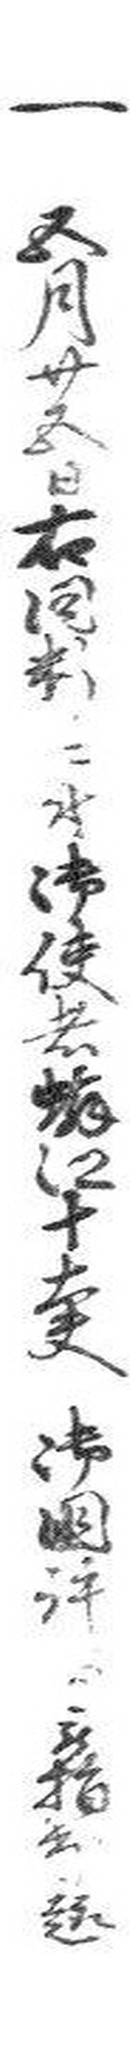一五月廿五日右同断ニ付御使者蠏江十大夫御国許江被指出候趣
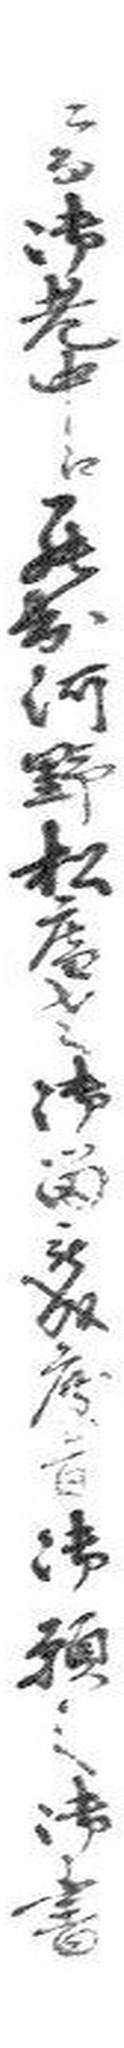ニ而御老中江罷出河野松庵老御留被成度旨御願之御書
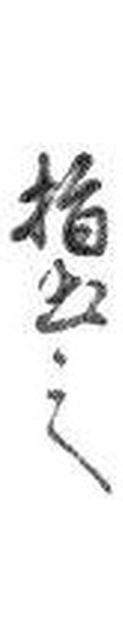指出之
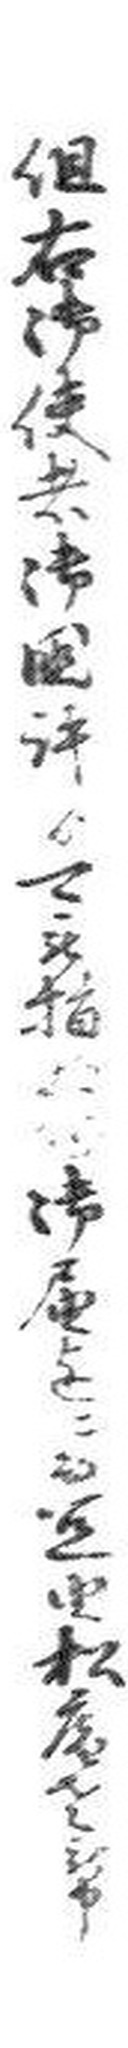但右御使者御国許ゟ可被指出御届迄ニ而宜由松庵老被申
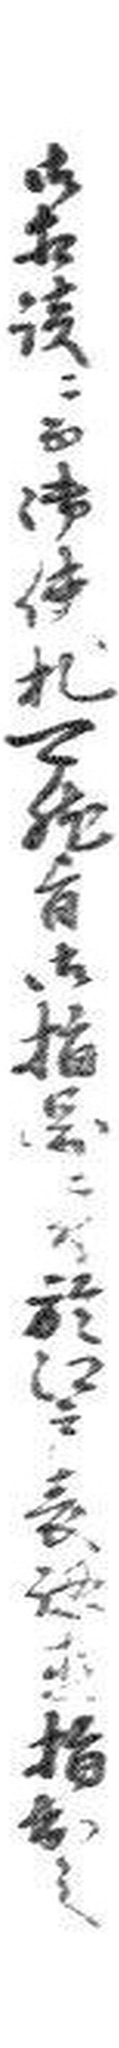御相談ニ而御使札可然旨御指図ニ付於江戸表認直指出之
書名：家譜 二十六 吉品公 従宝永七年到正徳二年
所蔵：福井県文書館 Fukui Prefectural Archives
